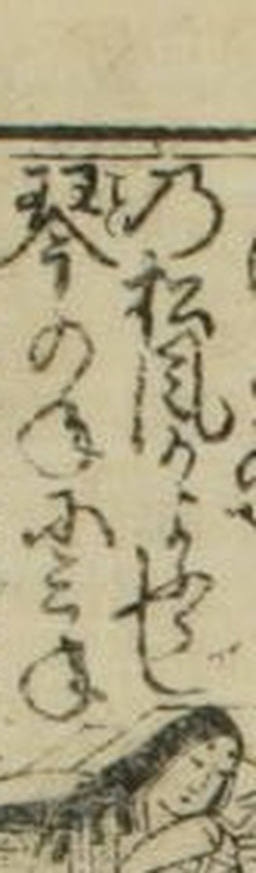琴のねにみね
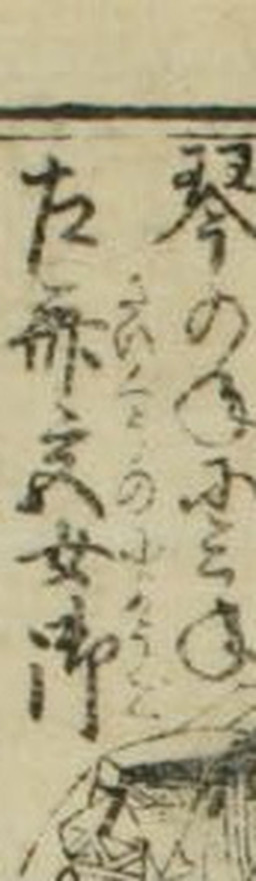左斎宮女御
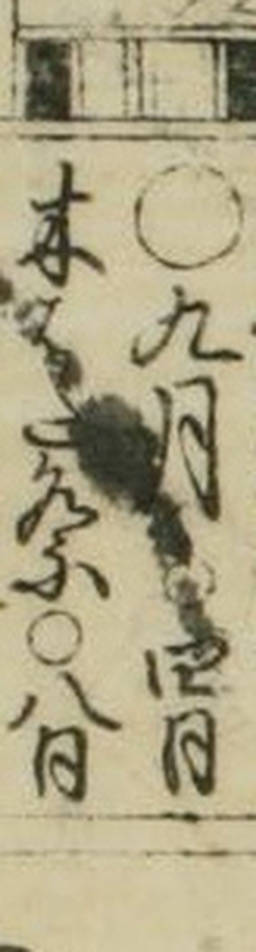木はた祭○八日
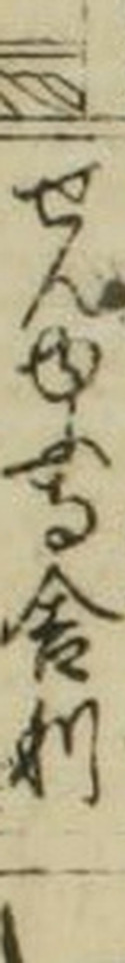せんゆふ寺舎利
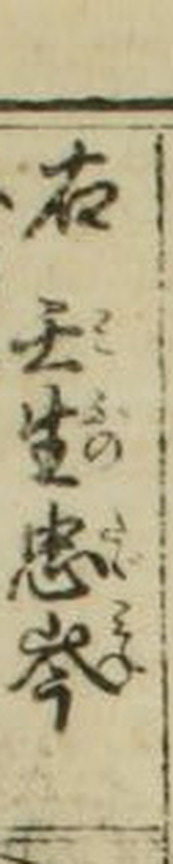右壬生忠岑
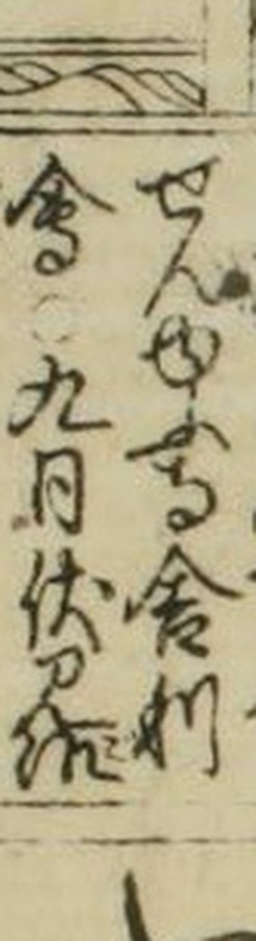会○九日伏見御
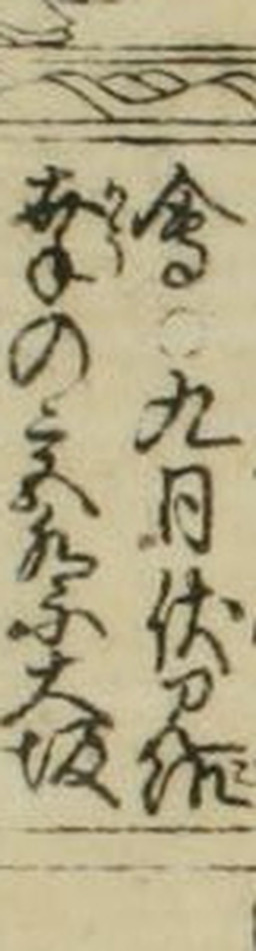幸の宮祭大坂
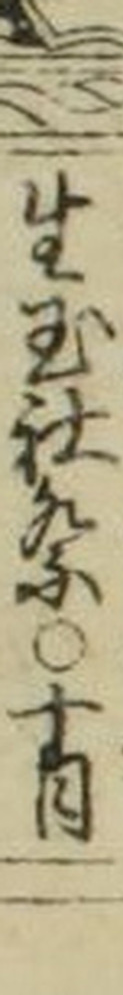生玉社祭○十日
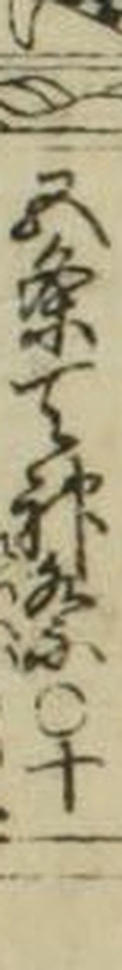五条天神祭○十
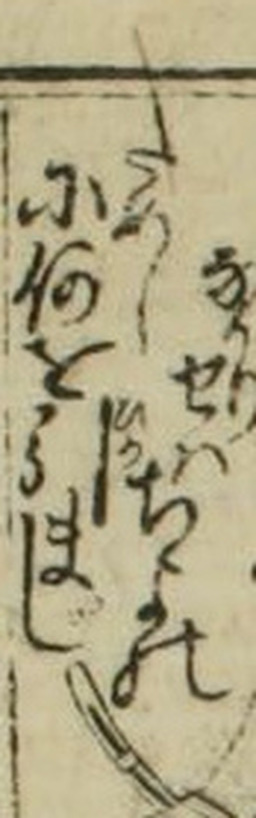に何を引まし
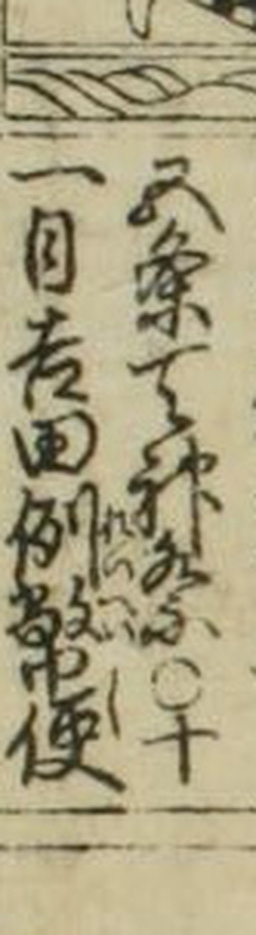一日吉田例幣使
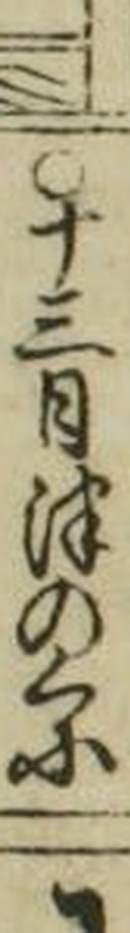○十三日津のくに
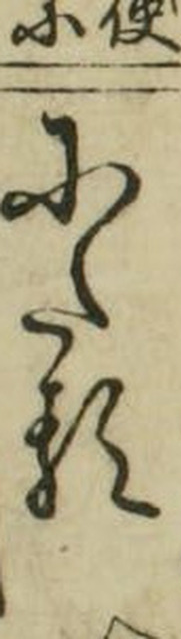にたる
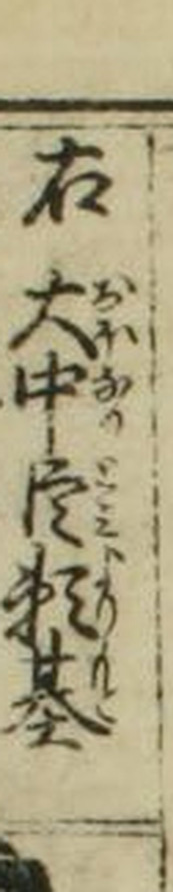右大中臣頼基
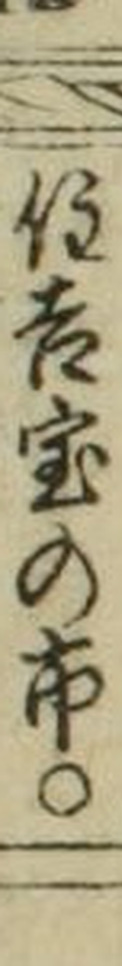住吉宝の市○
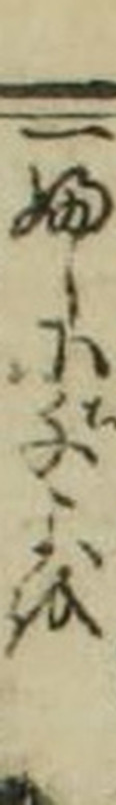一ふしに千よを
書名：女源氏教訓鑑
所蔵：東京学芸大学附属図書館
